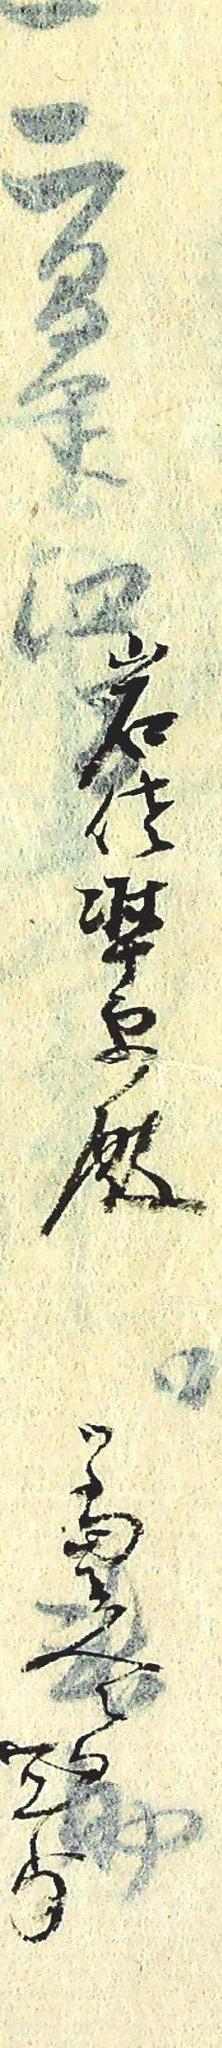岩佐準平殿御番壱人にて
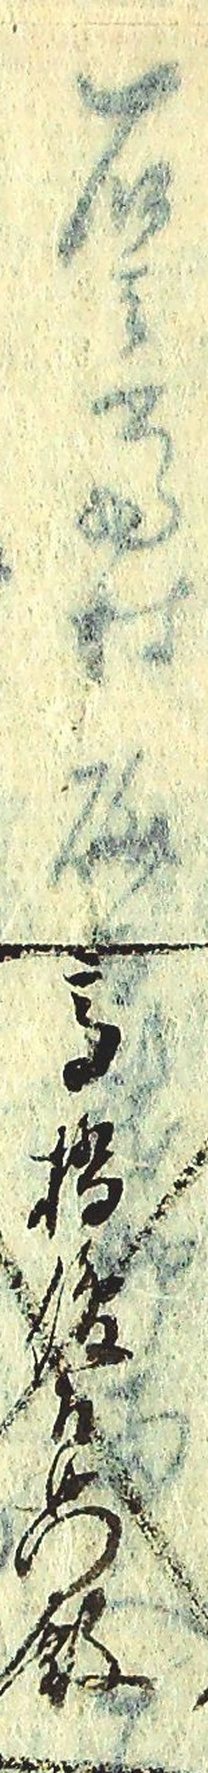高橋俊左衛門殿
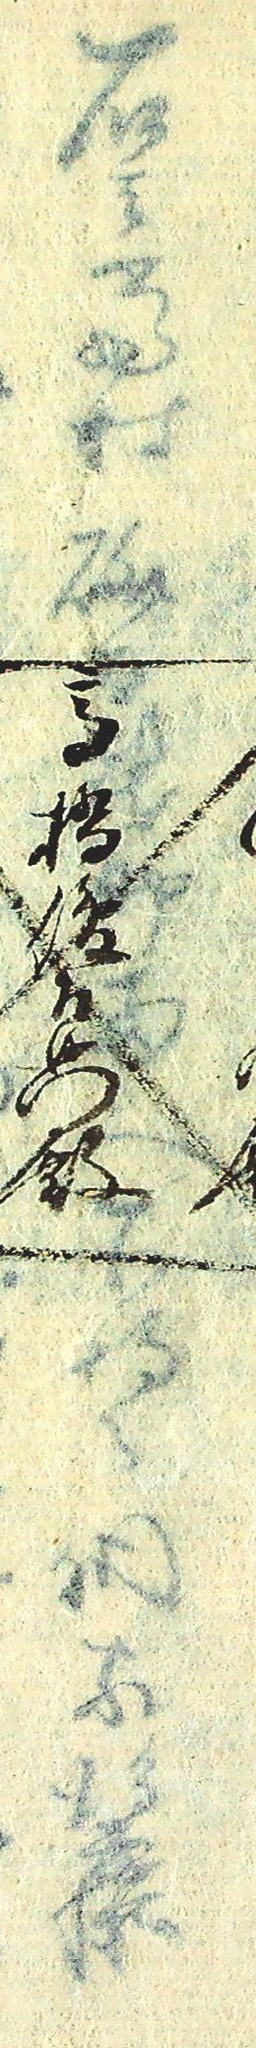高橋俊左衛門殿
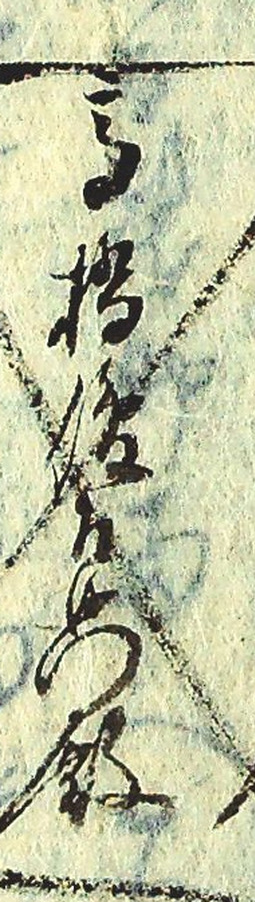高橋俊左衛門殿
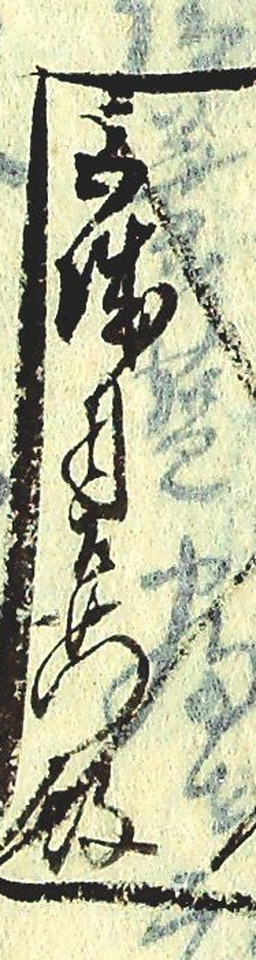宮城周左衛門殿
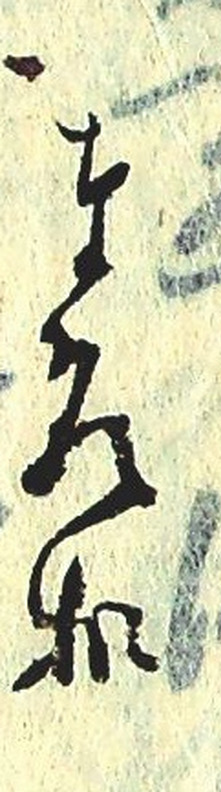奉願扣
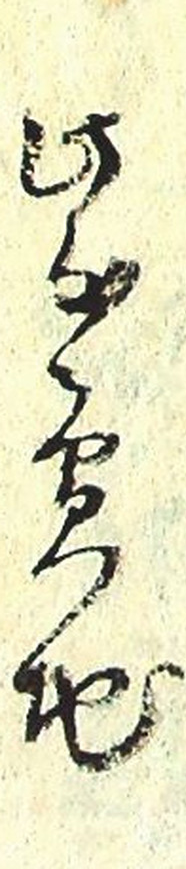此度売地

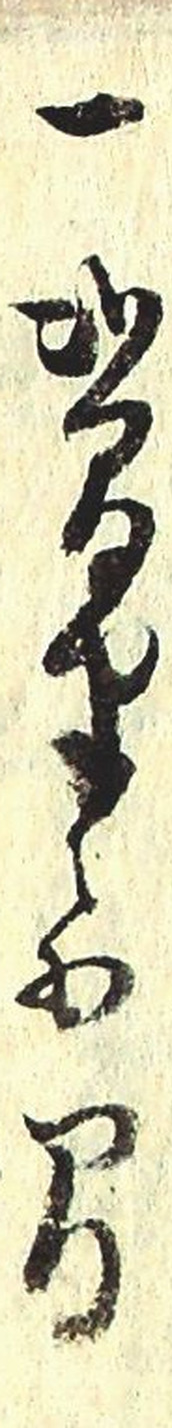一弐間半に四間同
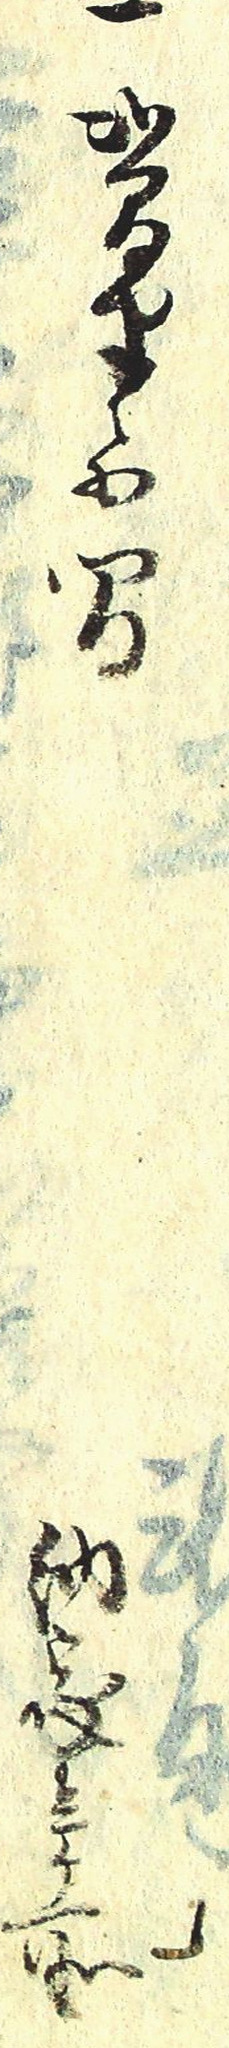一弐間半に五間納家壱ヶ所
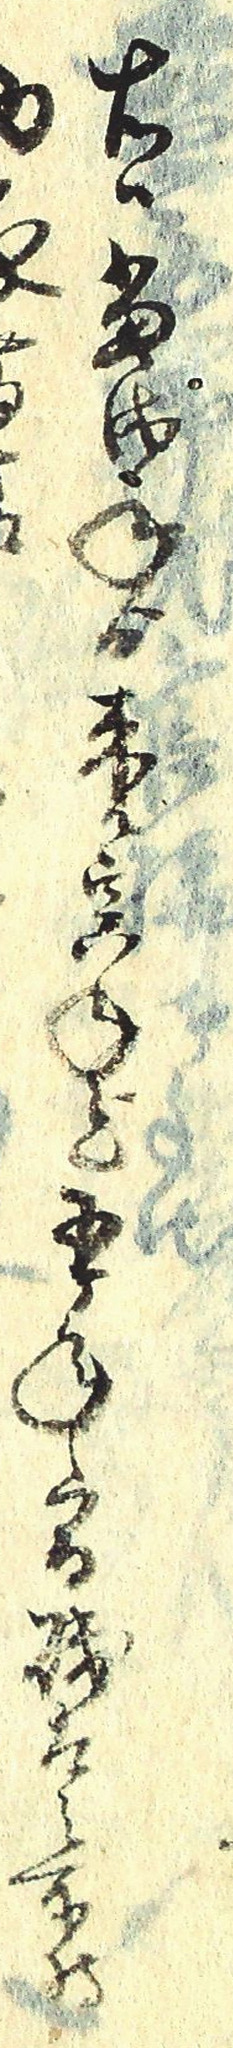右は当戌年ゟ来る寅年迄五ヶ年之間磯太之所持
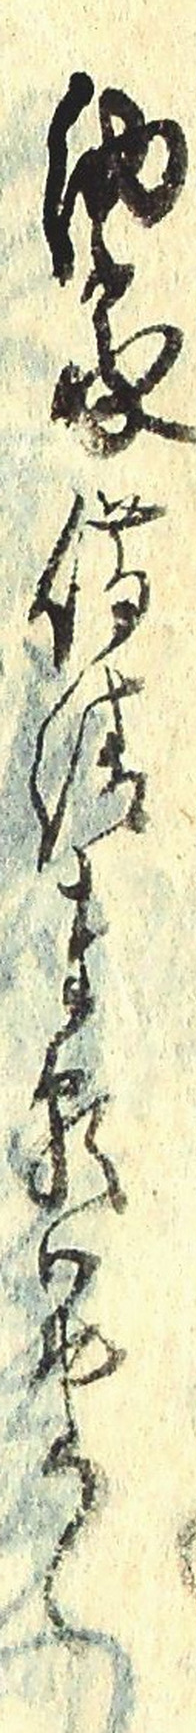納家借請奉願御座候
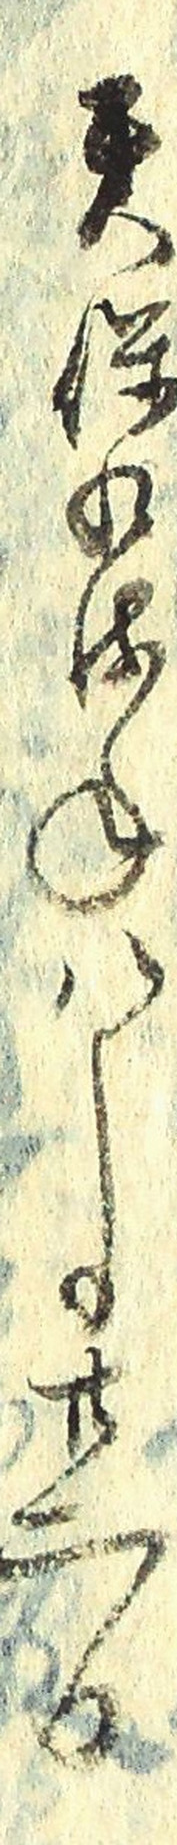天保九戌年八月廿二日
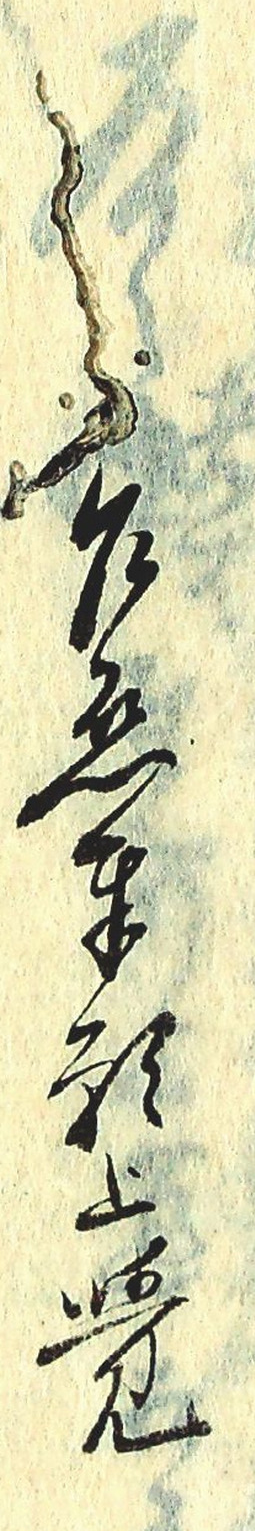乍恐奉願上覚
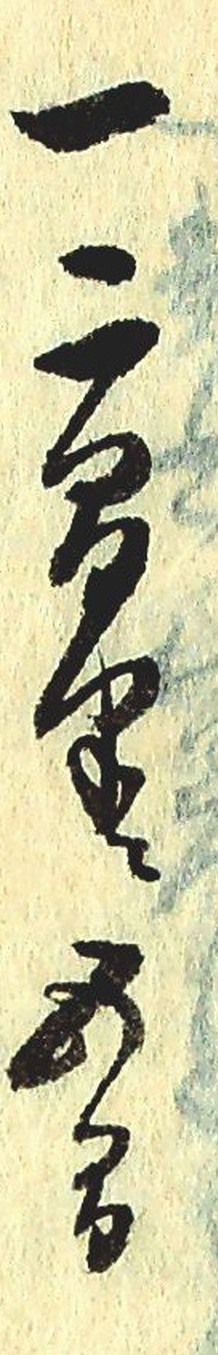一弐間半に四間同
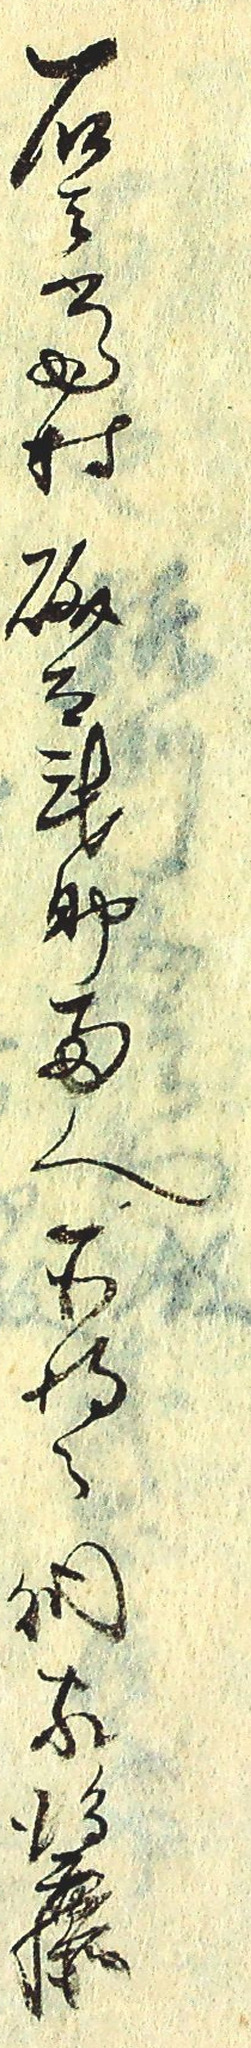右は当村磯太武助両人所持之納家後藤
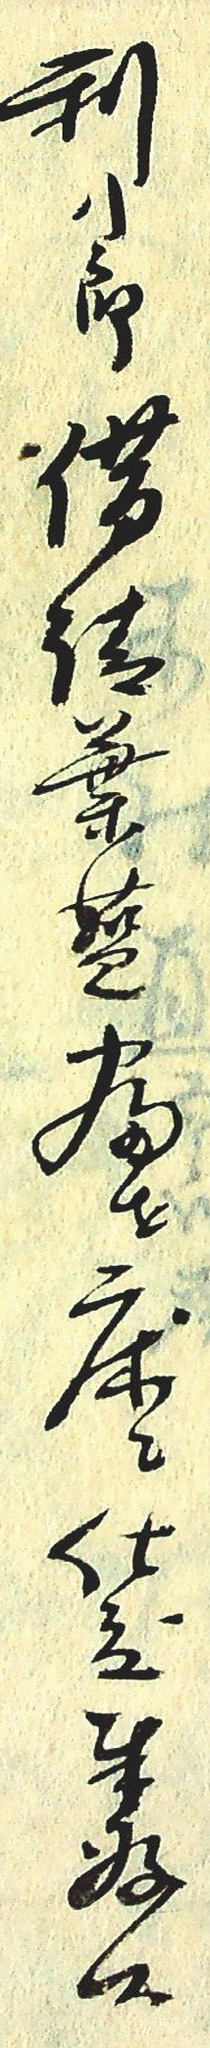利八郎借請葉藍寐せ床に仕度奉存候
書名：諸御願書控(弐番）
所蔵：鳴門教育大学 Naruto University of Education
